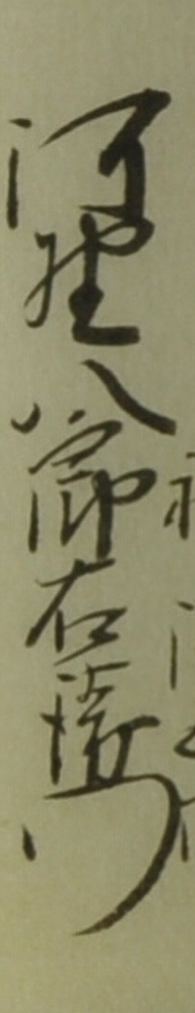河野八郎右衛門
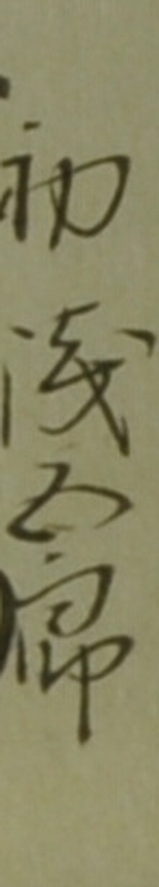初浅五郎

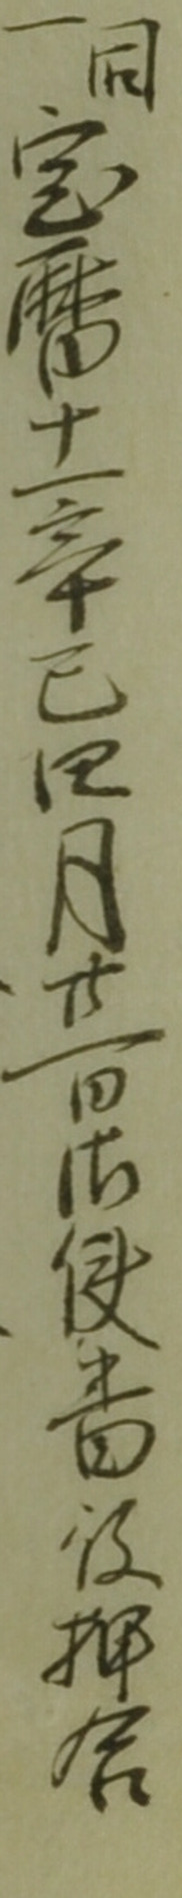一宝暦十一辛巳四月廿一日御使番役押合
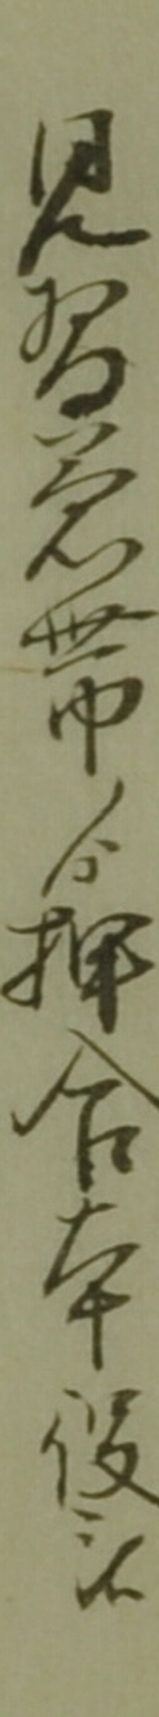見習兼帯ゟ押合本役被
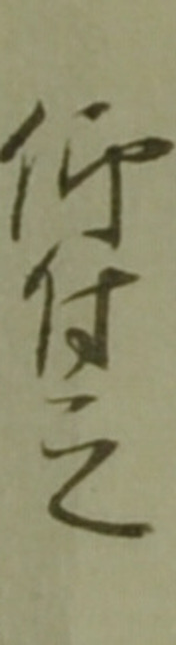仰付之
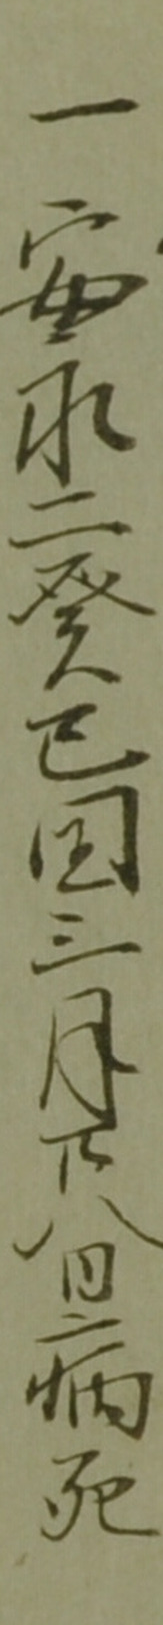一安永二癸巳閏三月廿八日病死
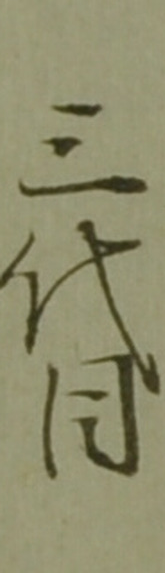三代目
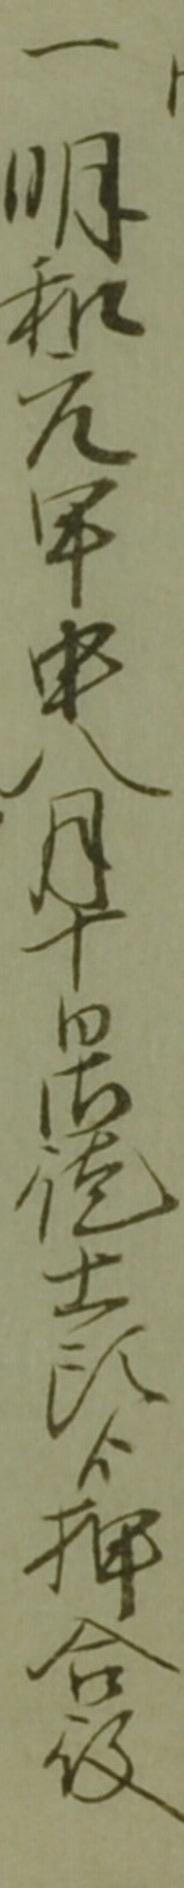一明和元甲申八月十日御徒士頭ゟ押合役
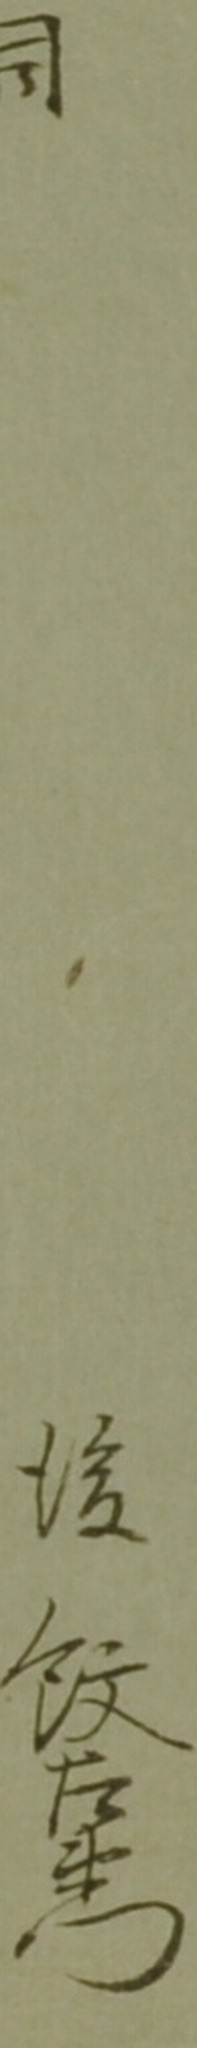後紋左衛門
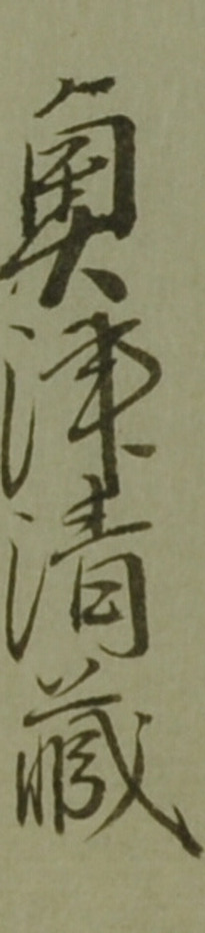奥津清蔵
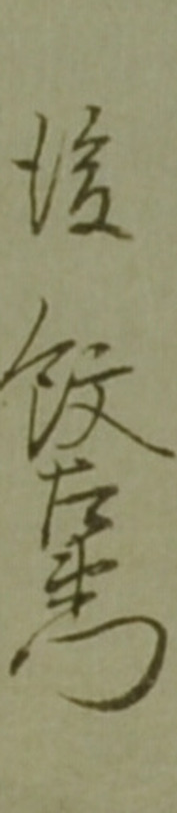後紋左衛門
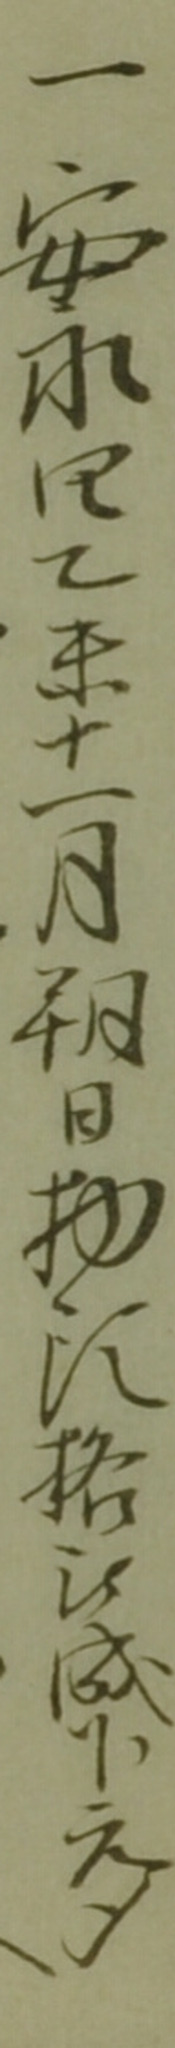一安永四乙未十一月朔日物頭格被成下元〆
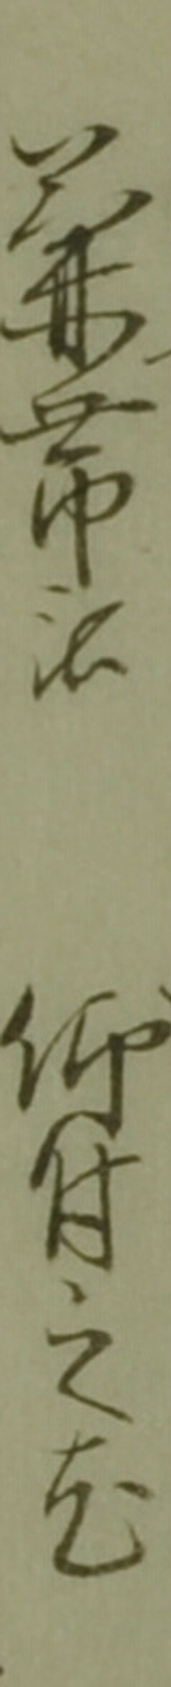兼帯被仰付之尤
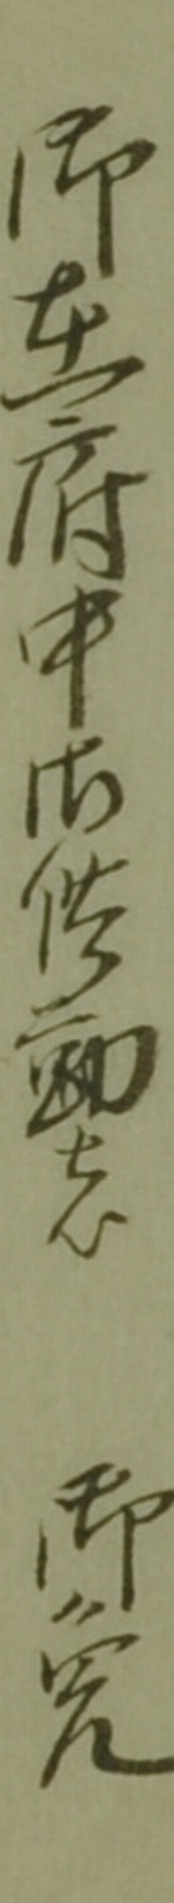御在府中御供勤者御免
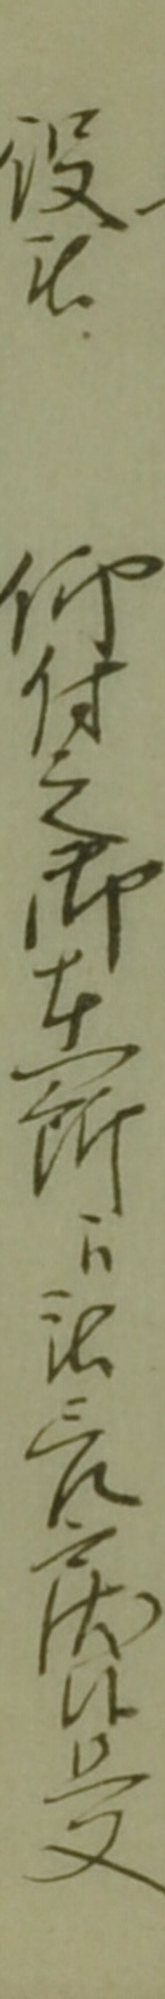役被仰付之御在所江被差戻候且又
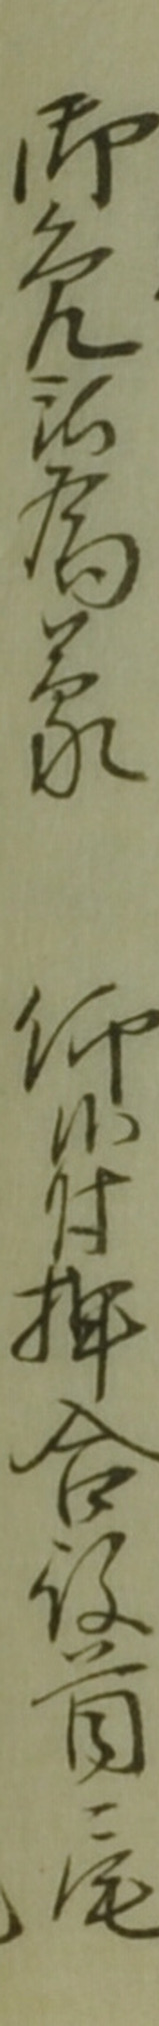御免被為蒙仰候付押合役首尾
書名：諸御役代々録（七）
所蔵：伊那市立高遠町図書館・合同会社AMANE
